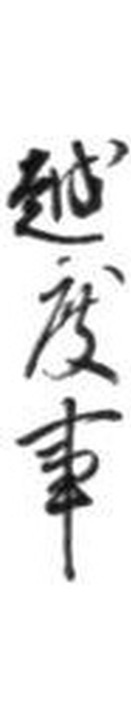越度事
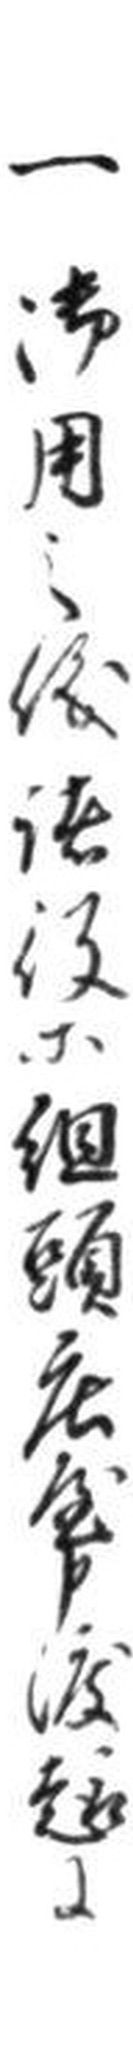一御用之儀諸役等組頭庄屋申渡趣に
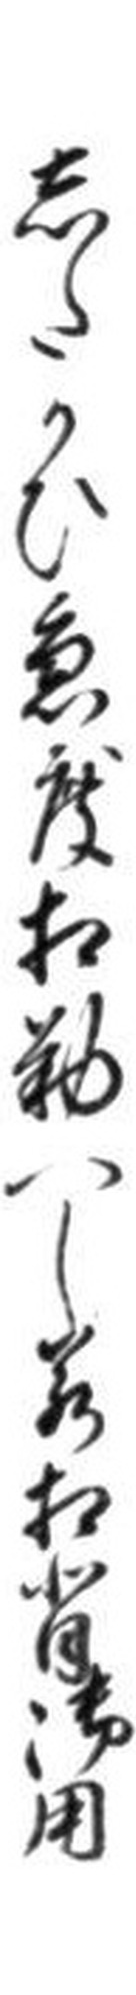したかひ急度相勤へし若相背御用
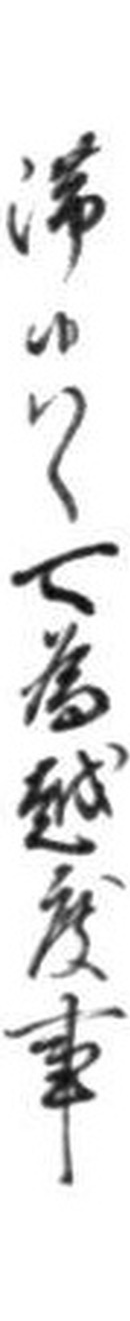滞候はゝ可為越度事
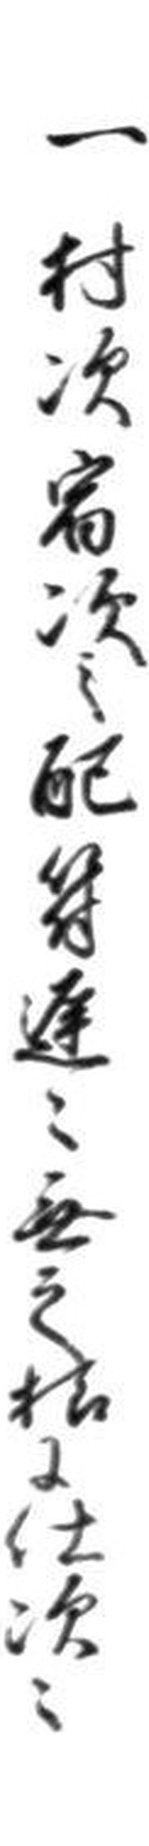一村次宿次之配符遅々無之様に仕次々
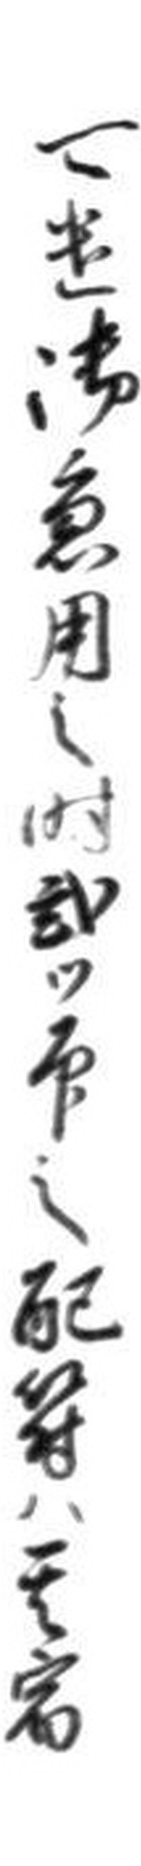可遣御急用之時弐ッ印之配符は其宿
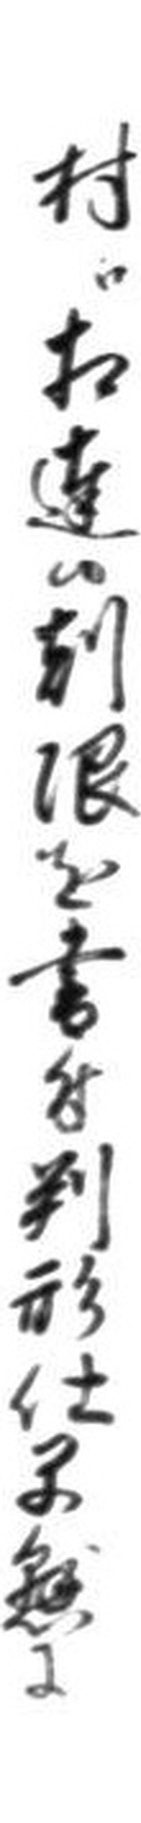村え相達候刻限を書付判形仕早懸に
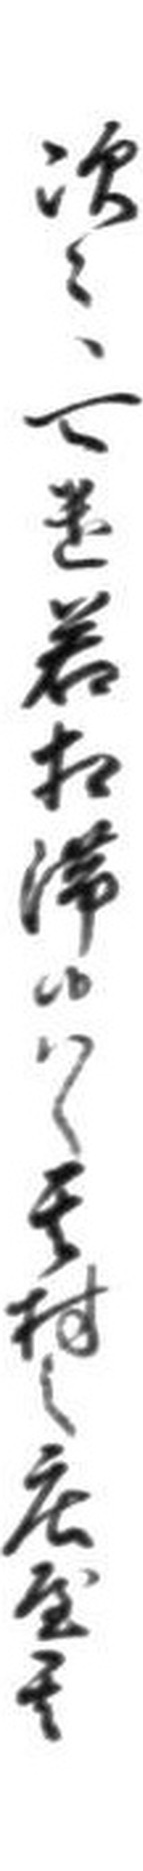次々へ可遣若相滞候はゝ其村之庄屋其
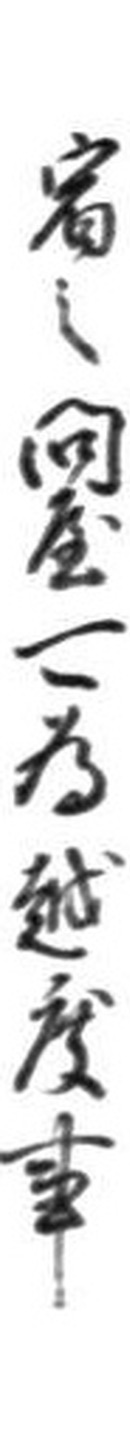宿之問屋可為越度事
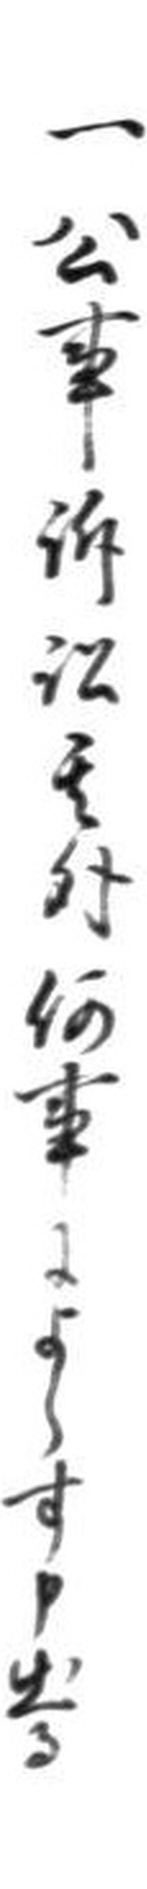一公事訴訟其外何事によらす申出る
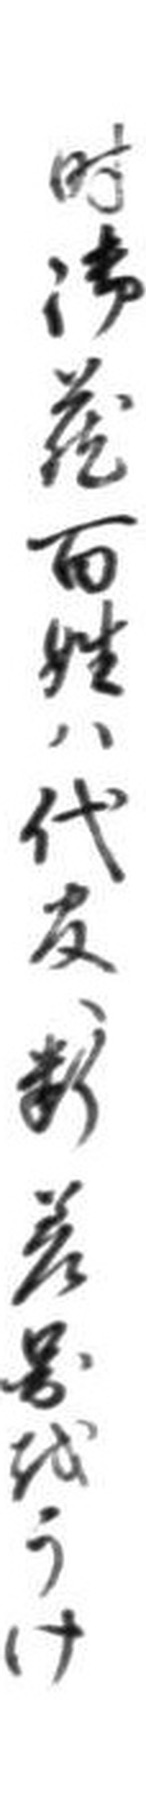時御蔵百姓は代官へ断差図をうけ
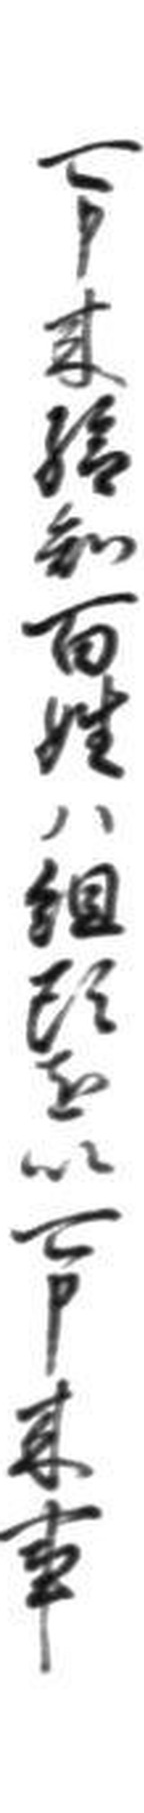可申来給知百姓は組頭を以可申来事
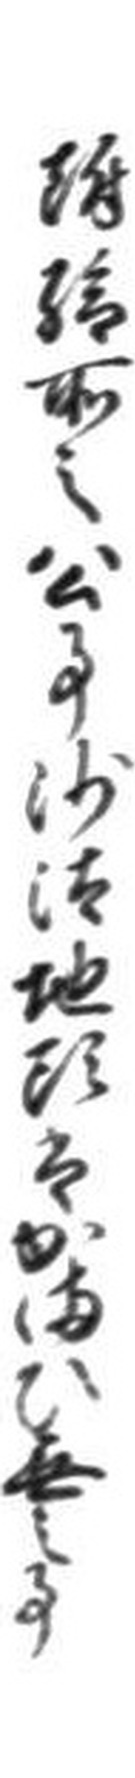附給所之公事沙汰地頭はかまひ無之事

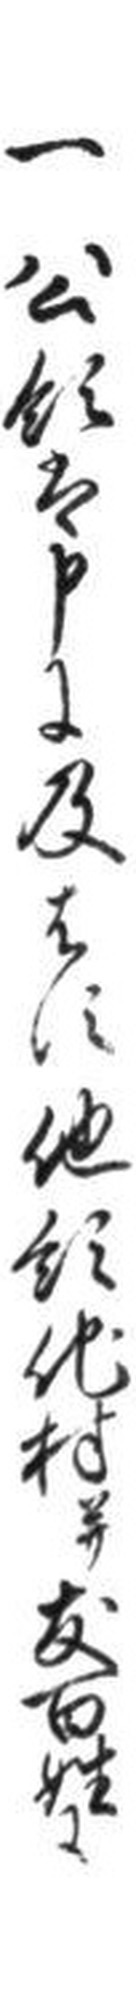一公領は申に及はす他領他村并友百姓に
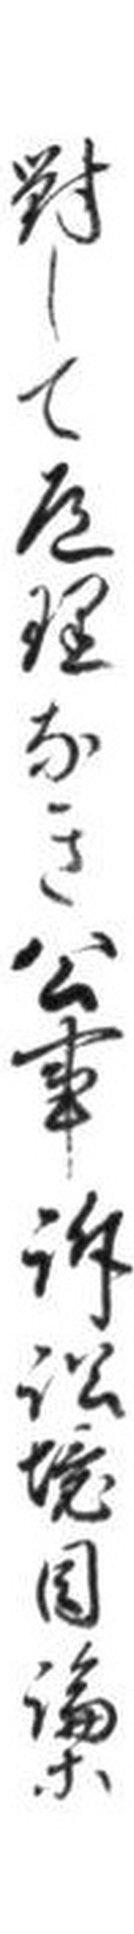対して道理なき公事訴訟境目論等
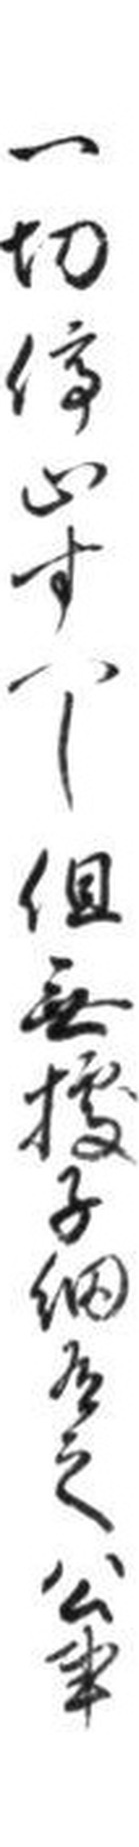一切停止すへし但無拠子細有之公事
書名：家譜 十六 吉品公 従貞享三年閏三月到同四年
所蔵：福井県文書館 Fukui Prefectural Archives
